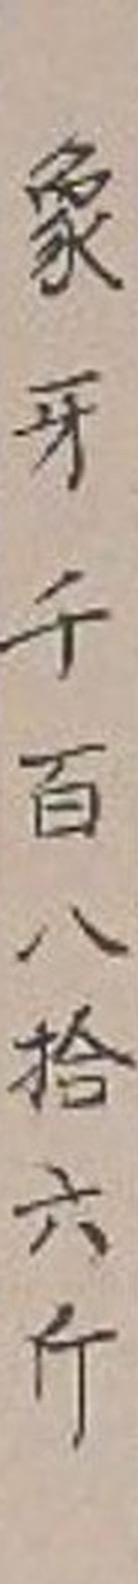象牙千百八拾六斤
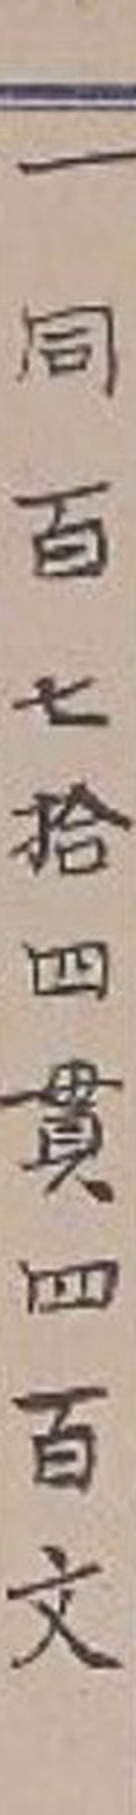一同百七拾四貫四百文
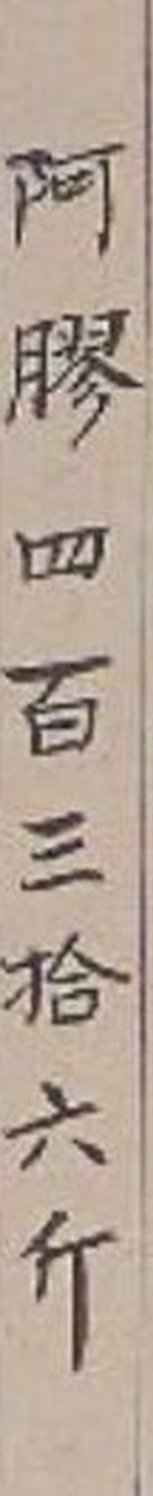阿膠四百三拾六斤

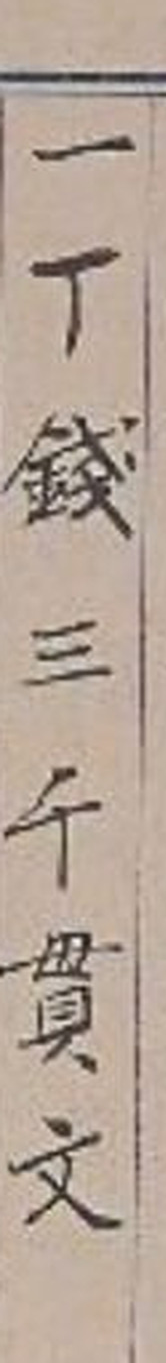一丁錢三千貫文
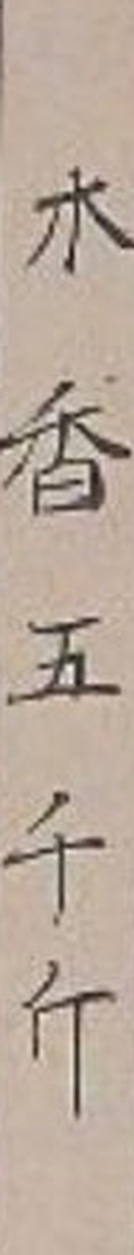木香五千斤
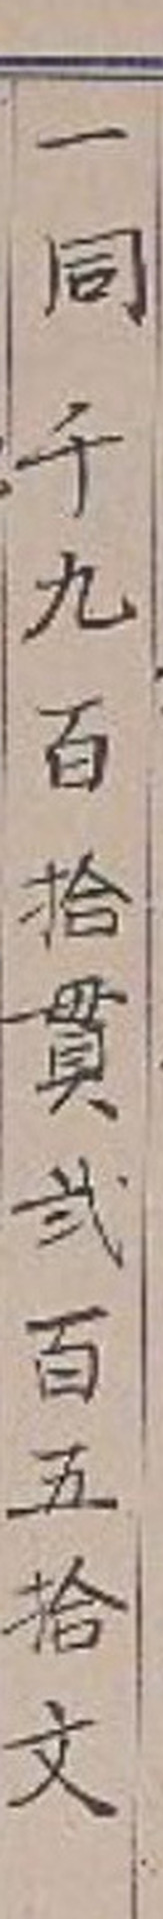一同千九百拾貫弐百五拾文
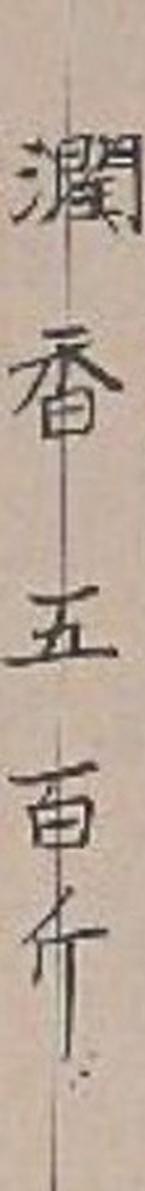潤香五百斤
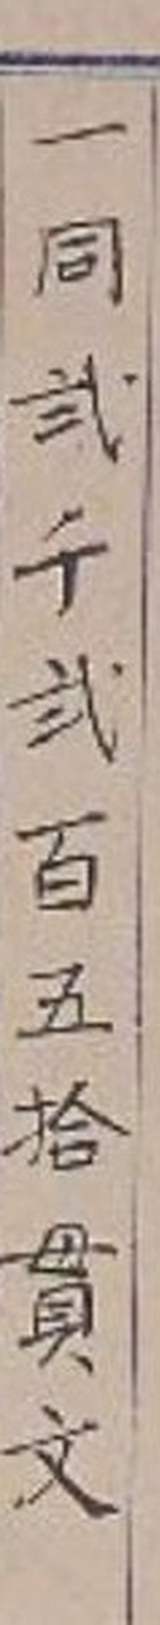一同弐千弐百五拾貫文
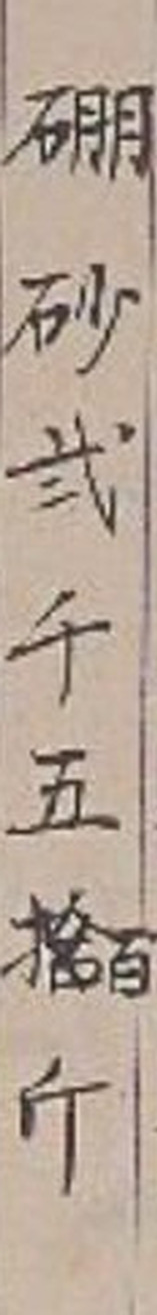硼砂弐千五斤
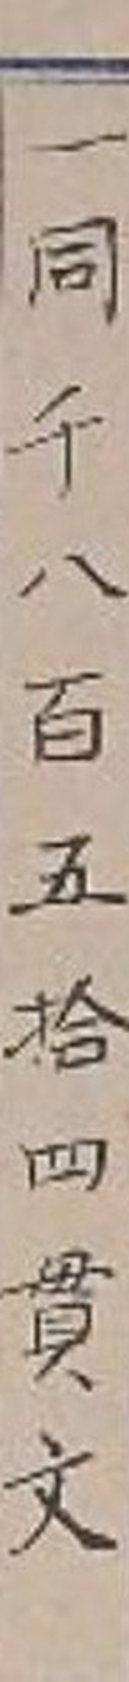一同千八百五拾四貫文
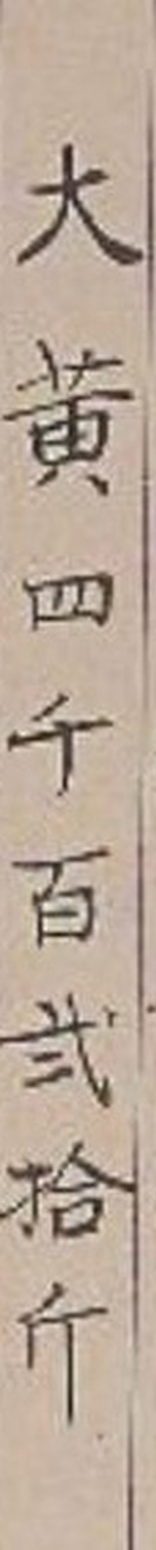大黄四千百弐拾斤
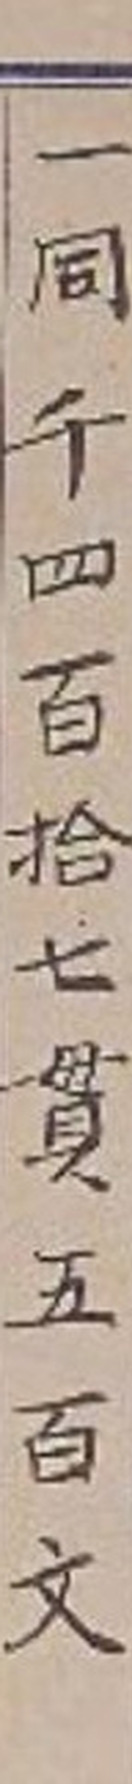一同千四百七貫五百文
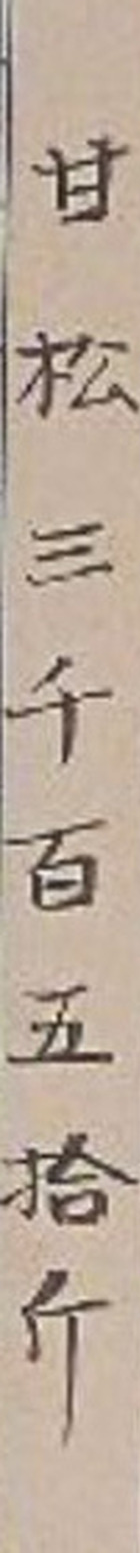甘松三千百五拾斤
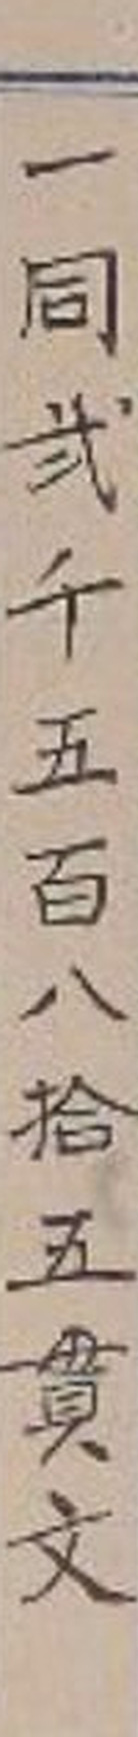一同弐千五百八拾五貫文
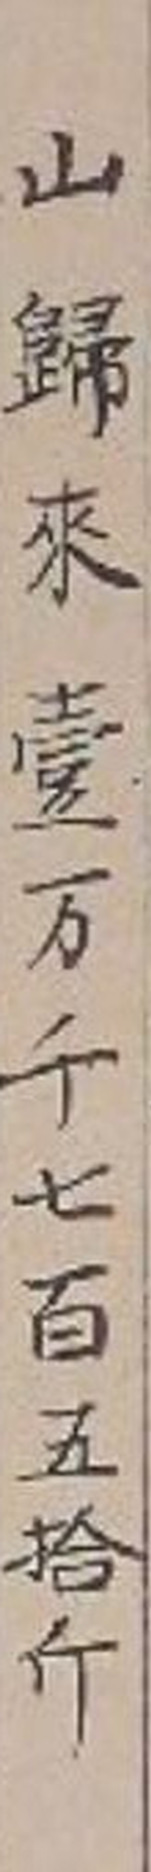山歸來壹万千七百五拾斤
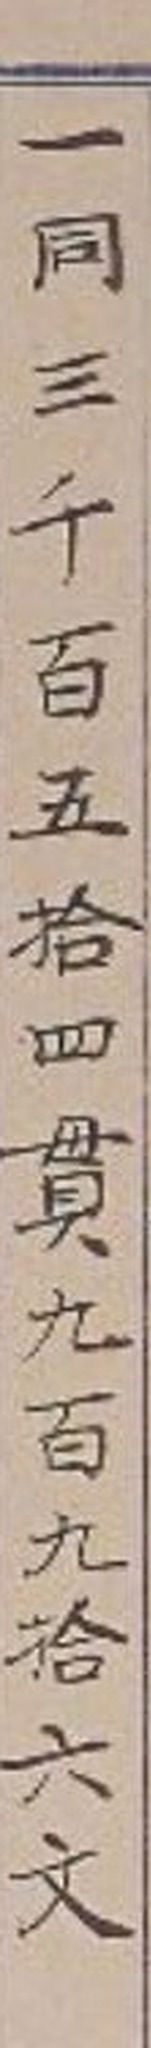一同三千百五拾四貫九百九拾六文
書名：琉球産物於長崎拂立並本手品利潤総帖 弘化四年より酉年迄
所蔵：University of the Ryukyus Library
